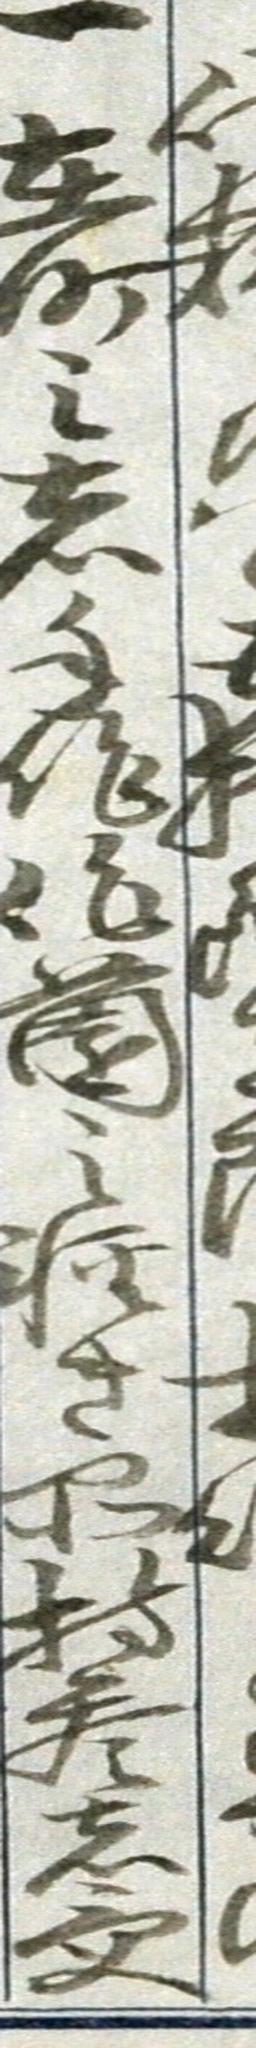一在町之者手作作薗之軽き品持参は受
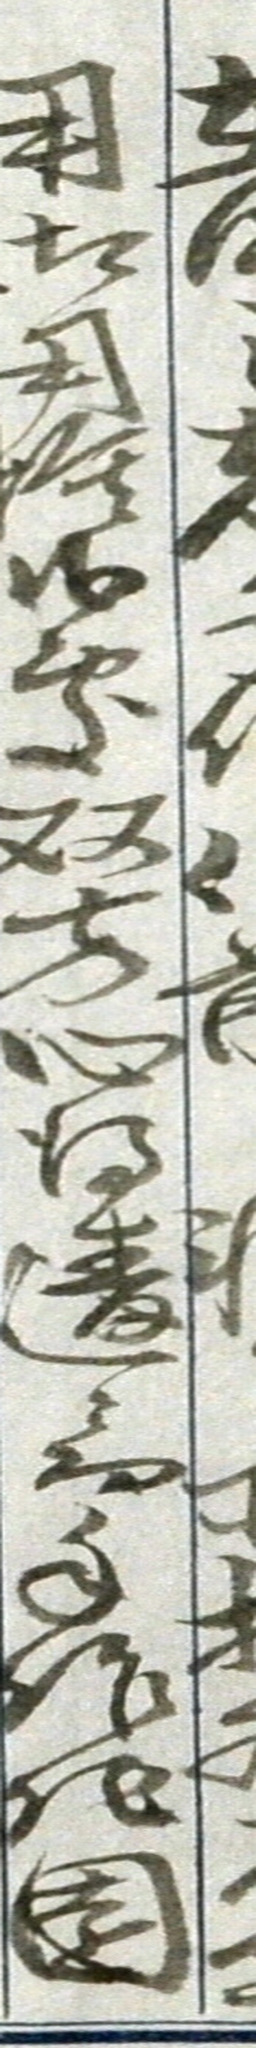用御用捨候処双方心得違ニ而手作作園
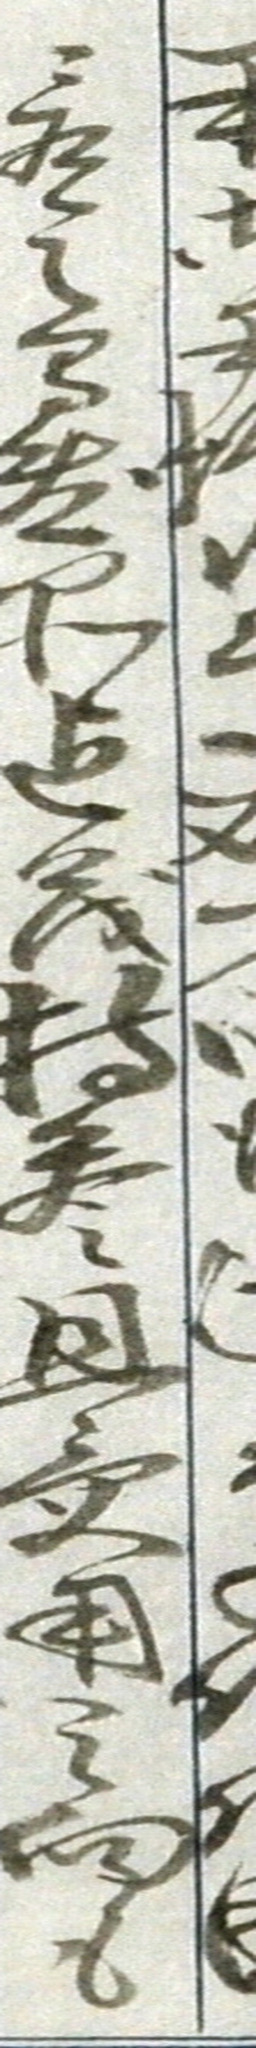ニ有之間敷品迄も持参且受用之向も
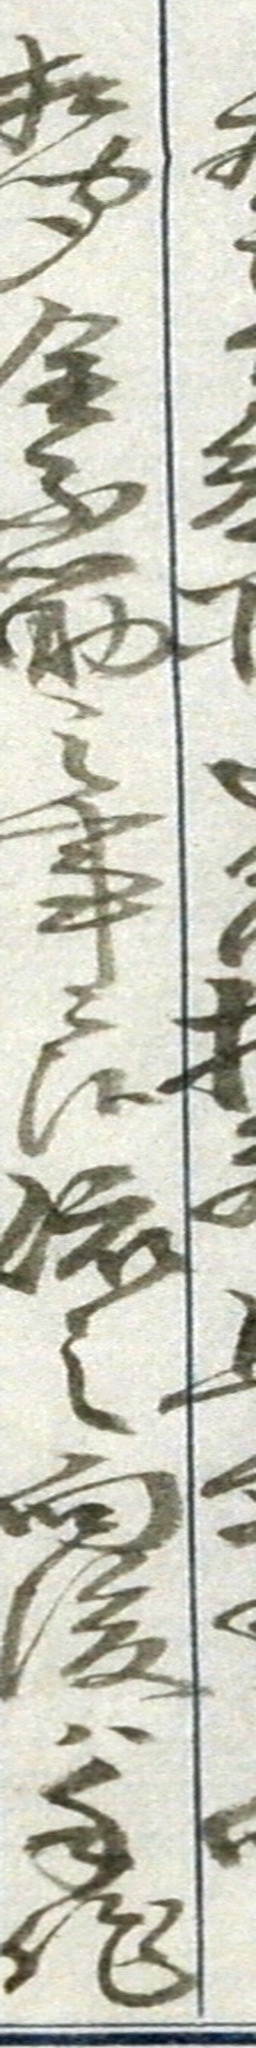相聞全不筋之事ニ候依之向後は手作
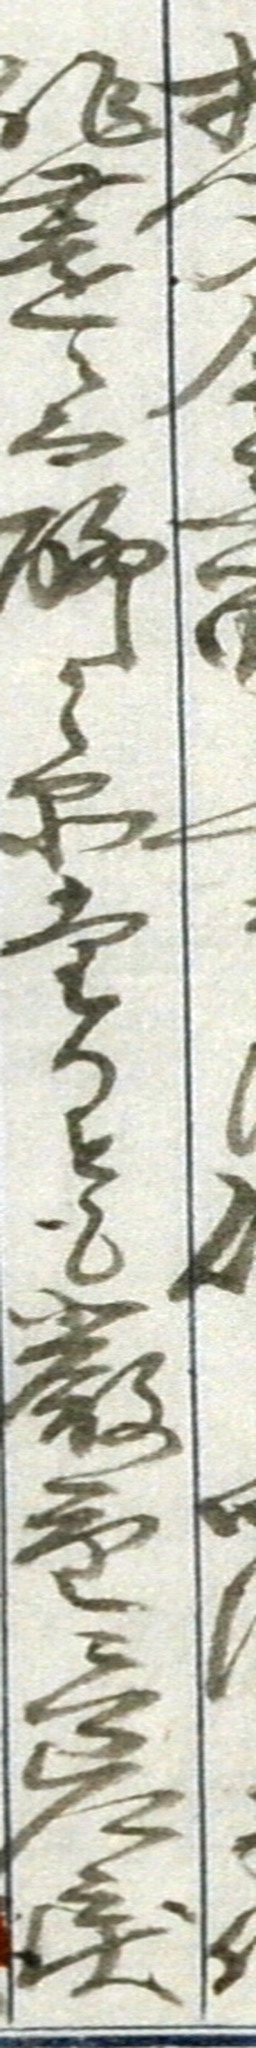作薗ニ而聊之品たりとも厳重ニ差戻
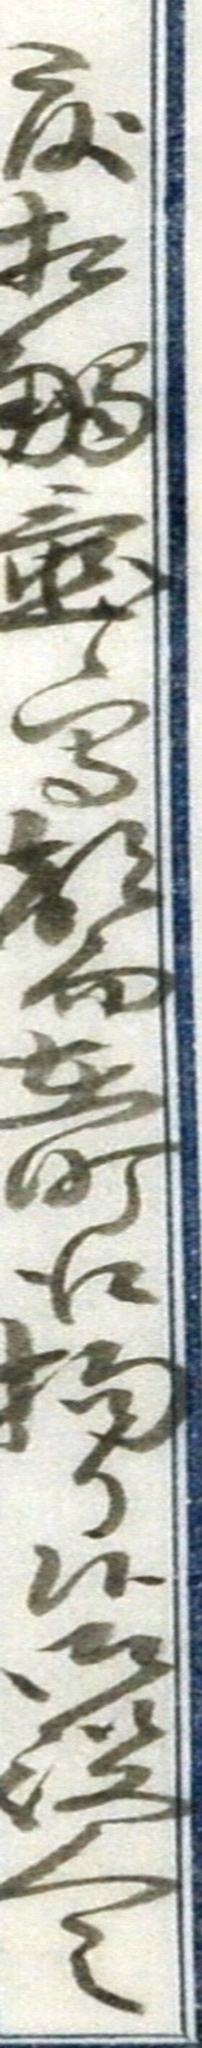度相触置候間都而在町え拘り候御役人之
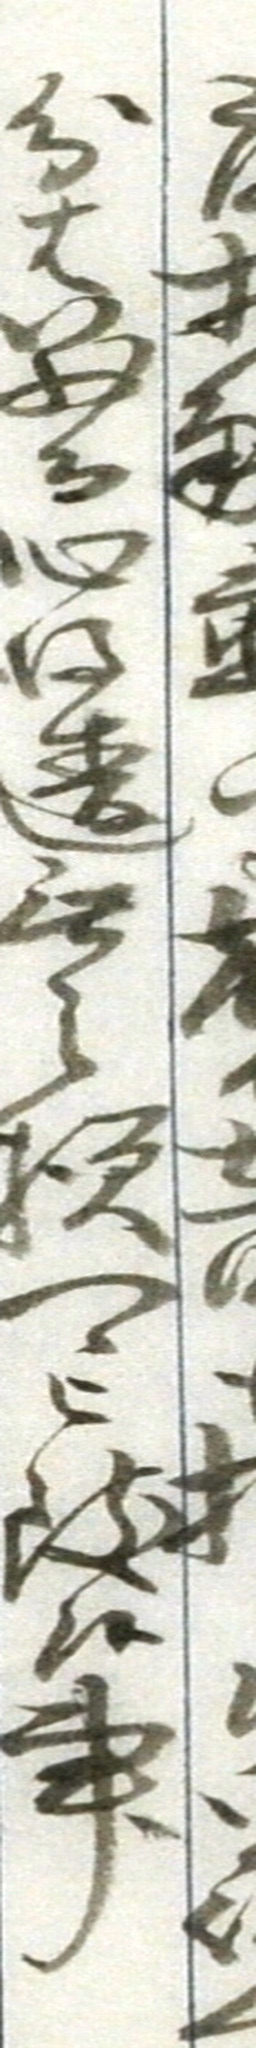分は別而心得違無之様可被致候事
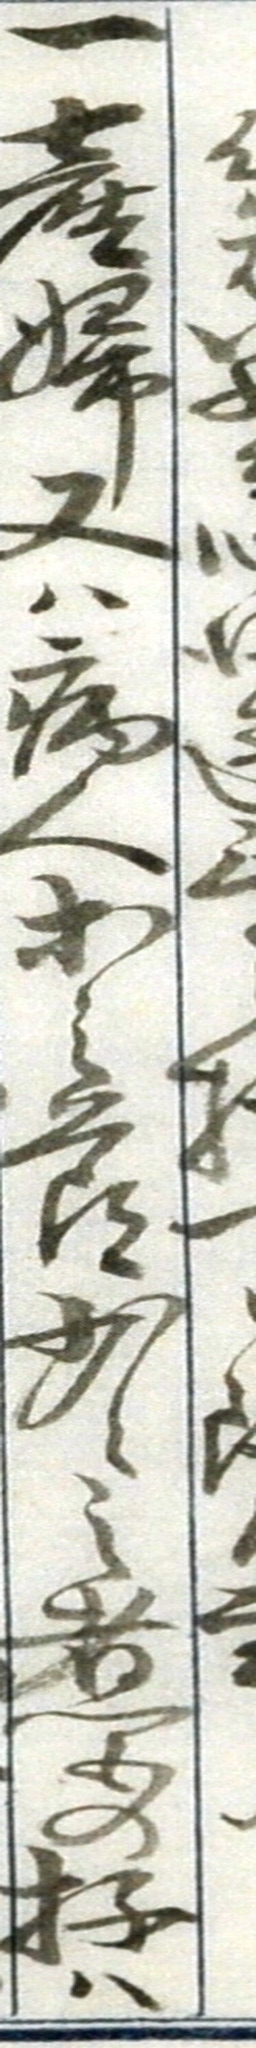一産婦又は病人等之節少し之煮もの抔は
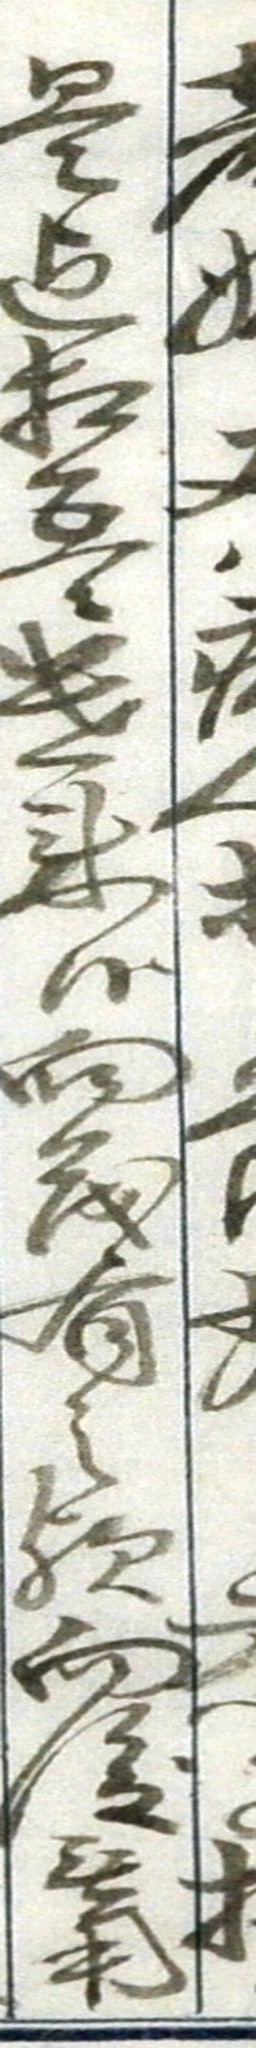是迄相互ニ遣来候向も有之欤向後無用
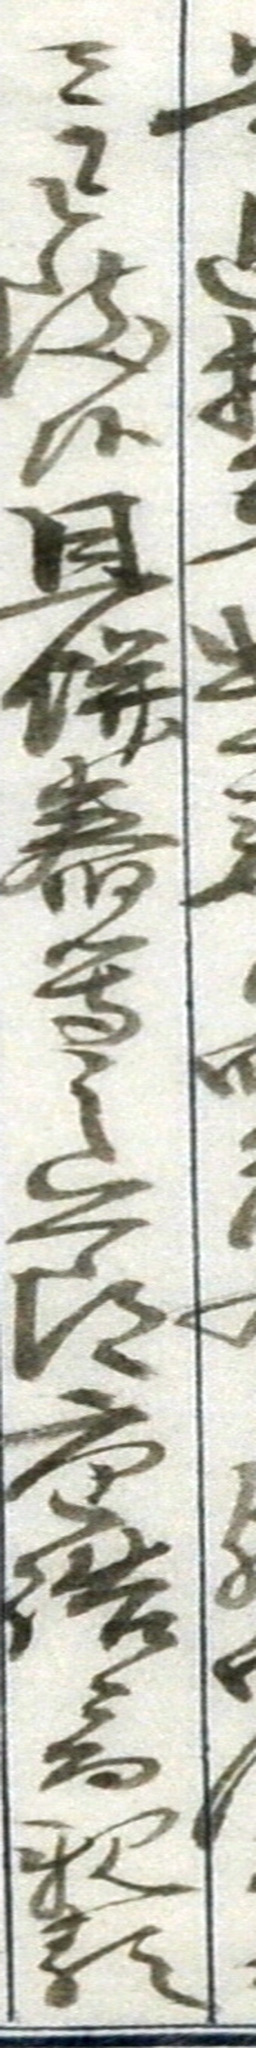ニ可被致候且餅舂等之節重詰ニ而親類
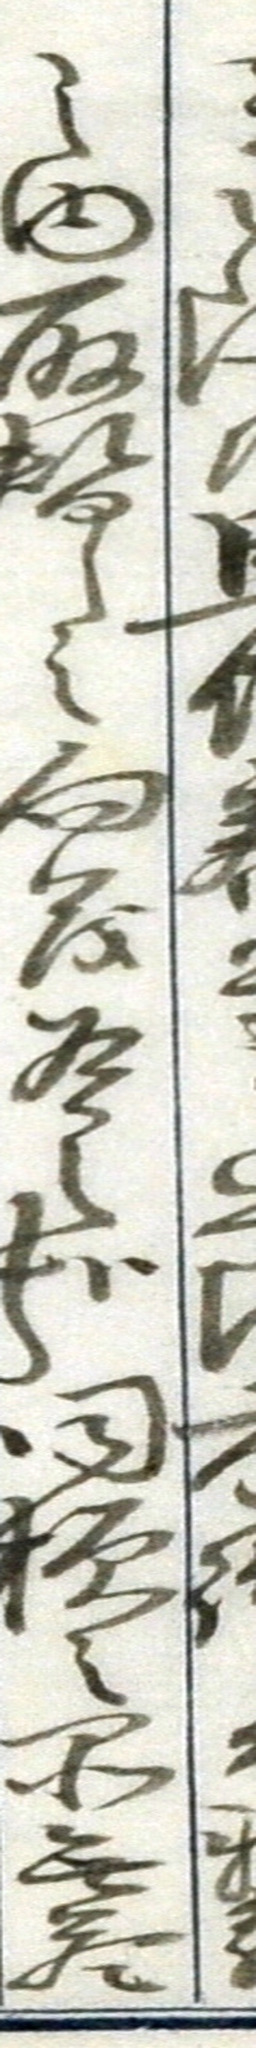之内取替し之向も有之哉同様之品無益
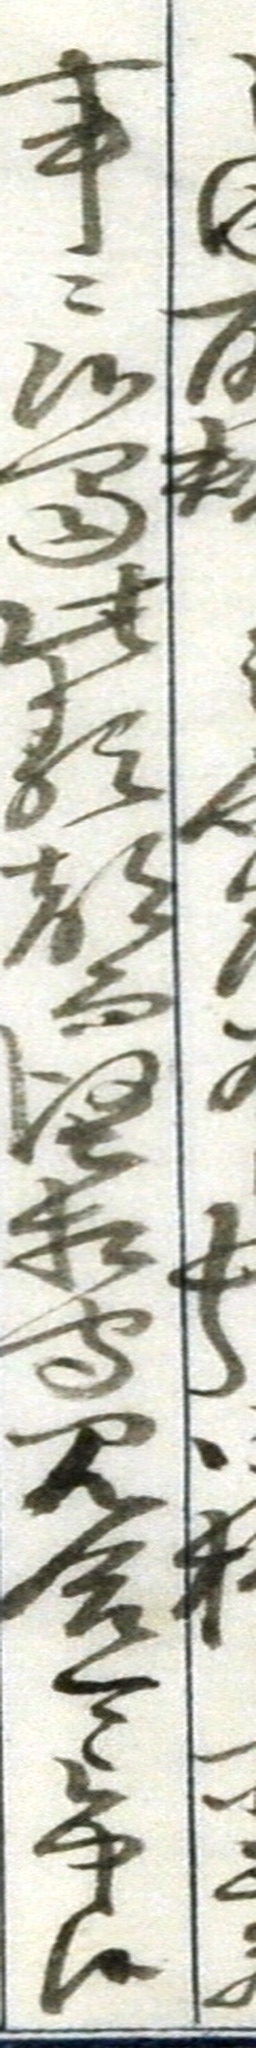事ニ候間此類都而堅相守見合可被申候
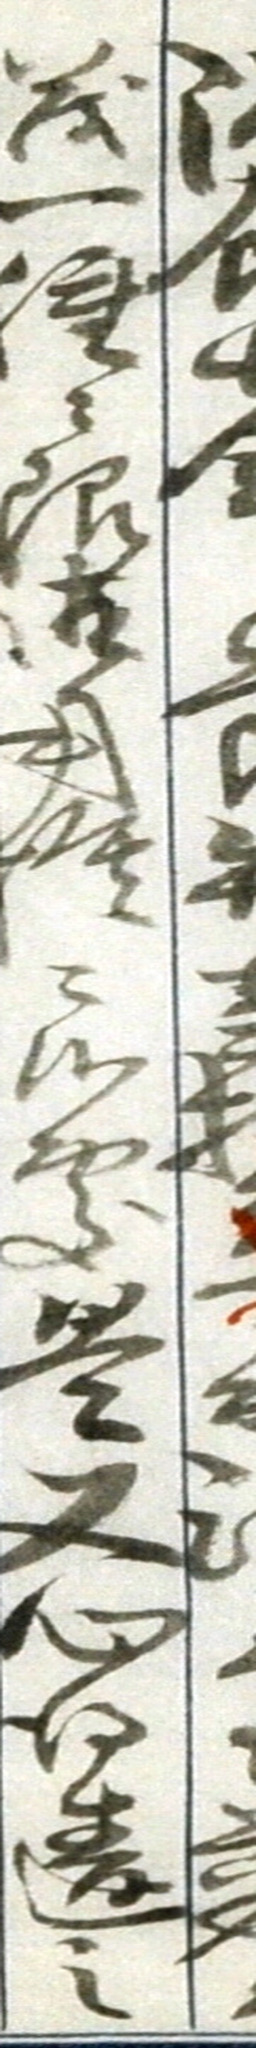も一種ニ限御用捨ニ候処是又心得違之
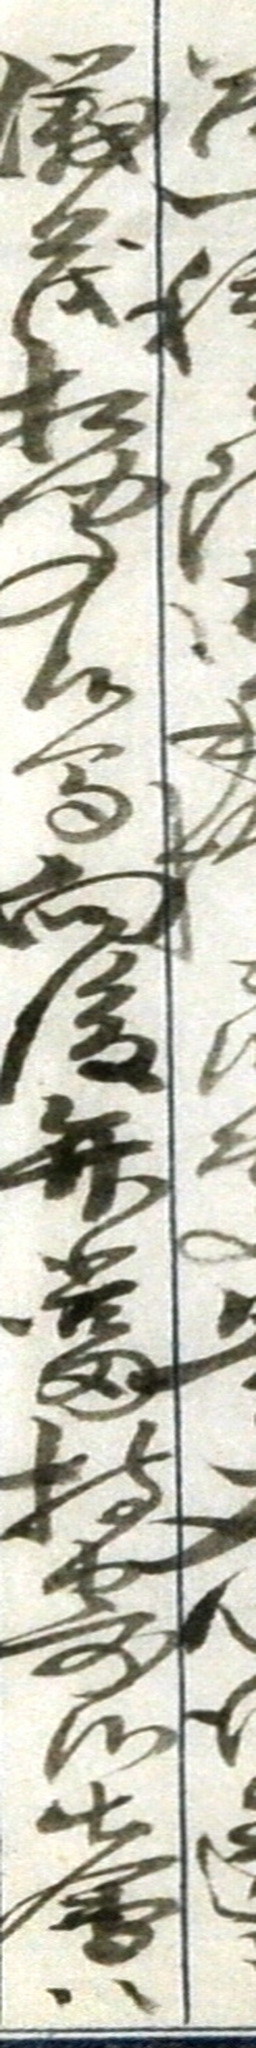儀も相聞候間向後弁当持寄候出会は
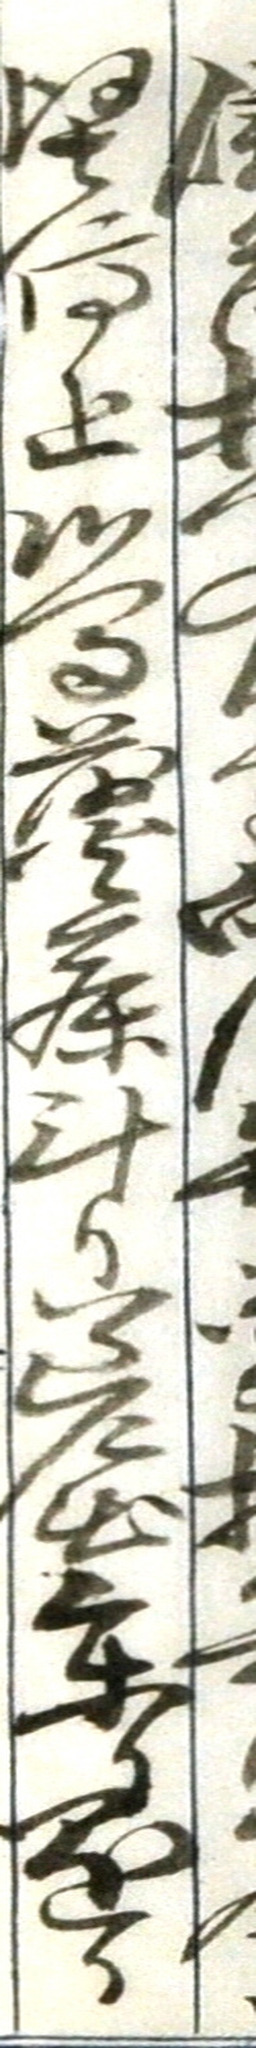堅停止候間煎茶計り差出参り懸り

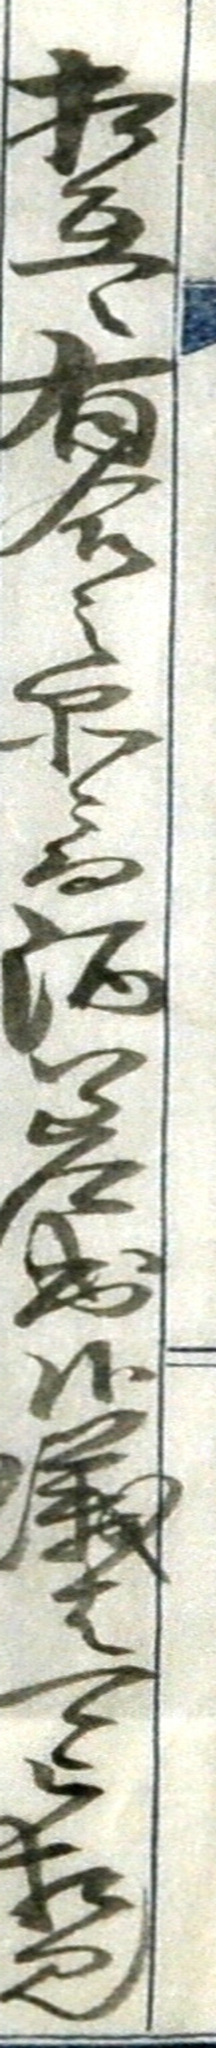相互ニ有合之品ニ而酒差出候儀は可被相見
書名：御倹約被仰出書
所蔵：伊那市立高遠町図書館・合同会社AMANE
